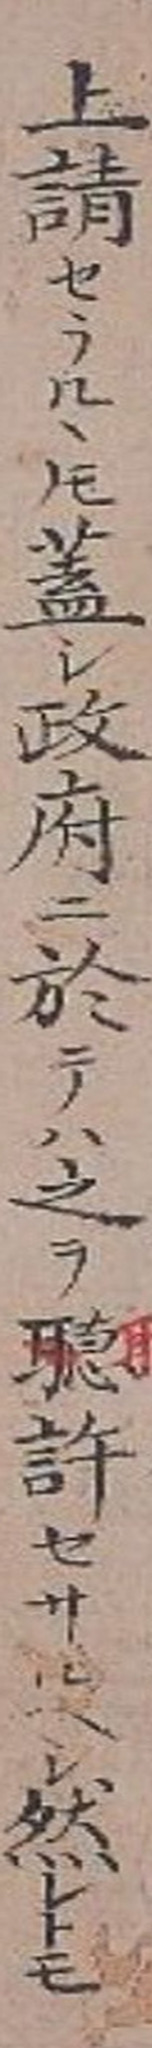上請セラルヽトモ蓋シ政府ニ於テハ之ヲ聴許セサルヘシ然レトモ
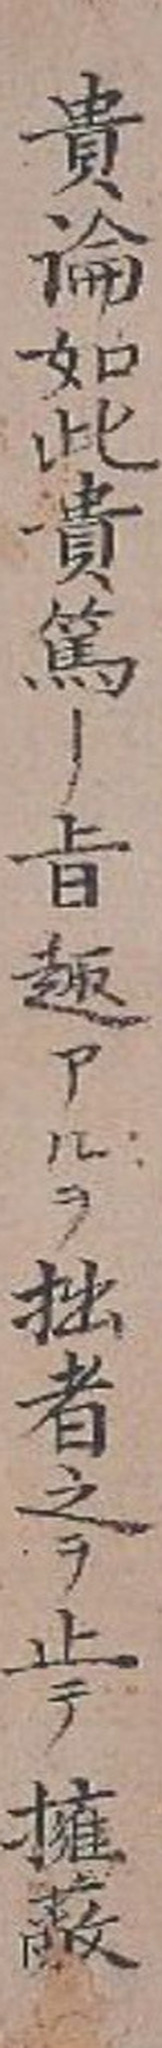貴論如此貴篤ノ旨趣アルヲ拙者之ヲ止テ擁蔽
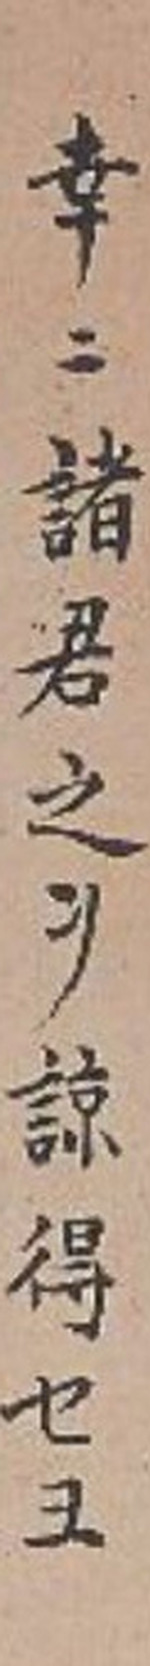幸ニ諸君之ヲ諒得セヨ
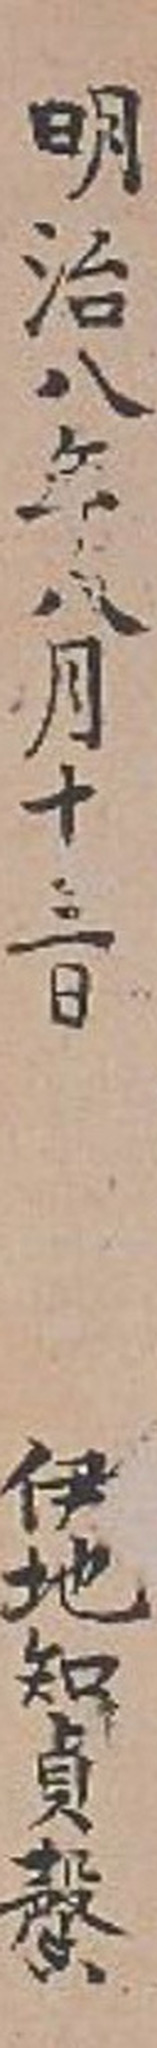明治八年八月十三日伊地知貞声
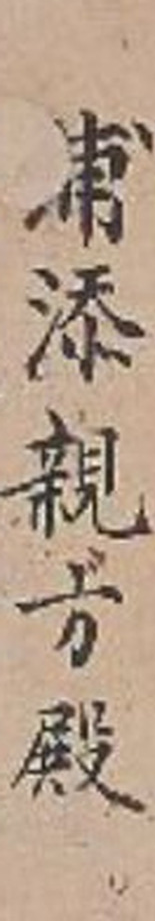浦添親方殿
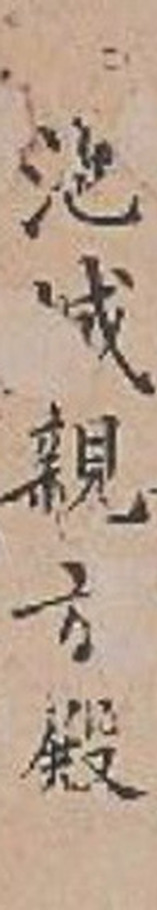池城親方殿
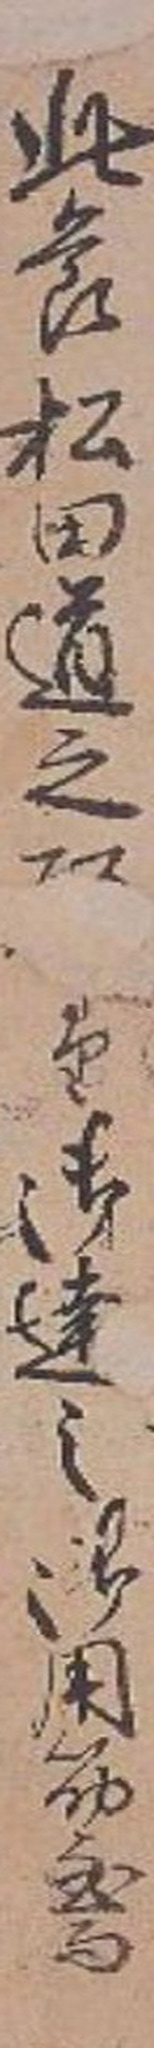此節松田道之殿重御達之銀用筋至而
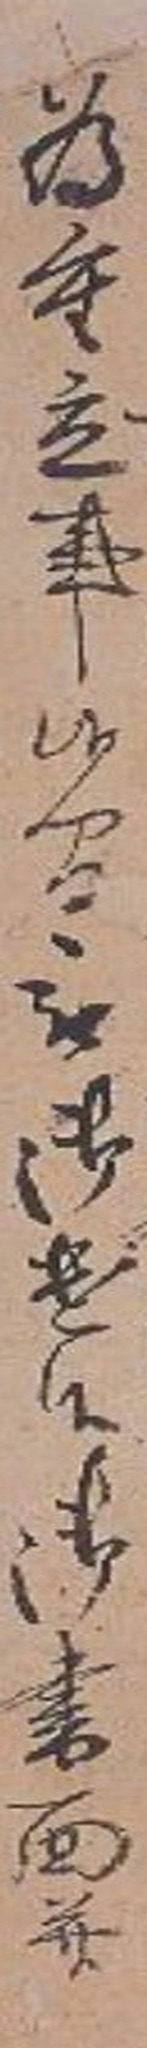為重立事候間被御遣候御書面幷
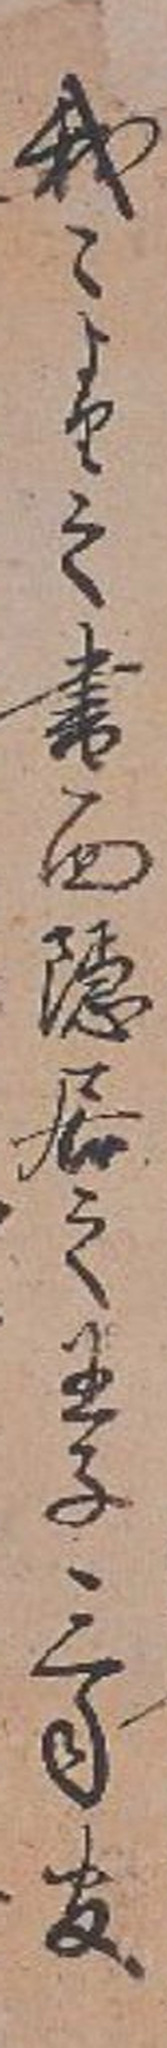我々より之書面隠居之王子三年発
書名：奉使琉球始末 草稿之一部
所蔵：University of the Ryukyus Library
